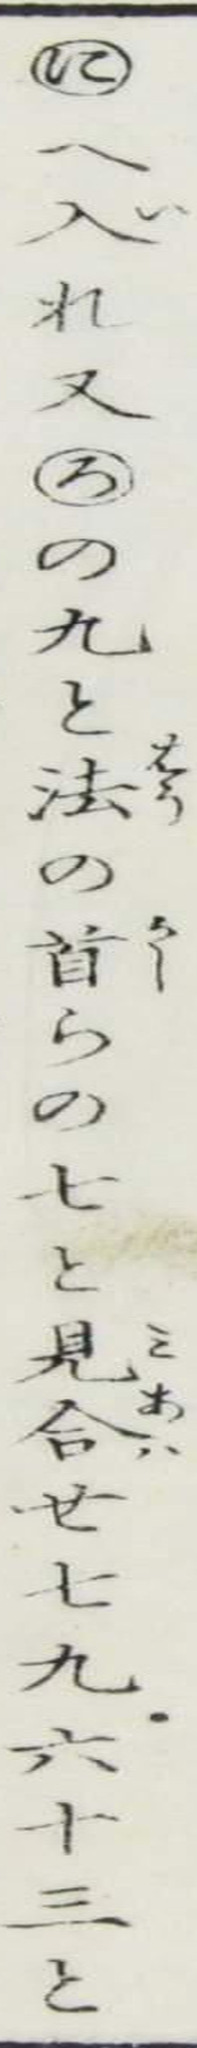㋥へ入れ又㋺の九と法の首らの七と見合せ七九．六十三と
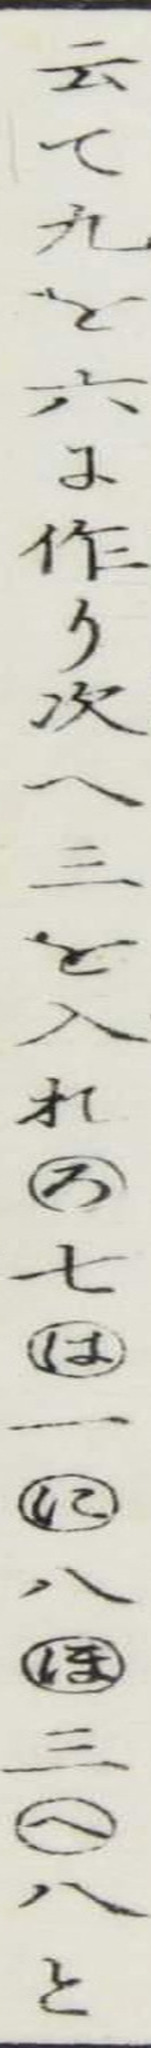云て九を六に作り次へ三を入れ㋺七㋩一㋥八㋭三㋬八と
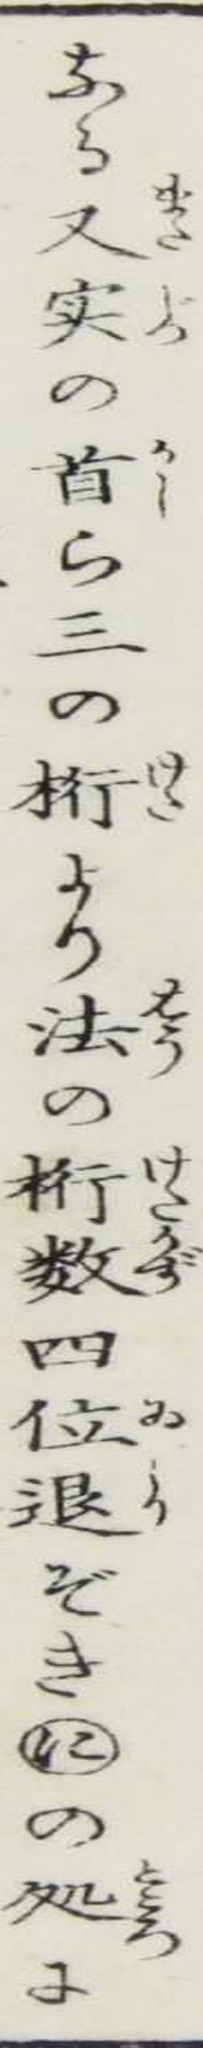なる又実の首ら三の桁より法の桁数四位退ぞき㋥の処に
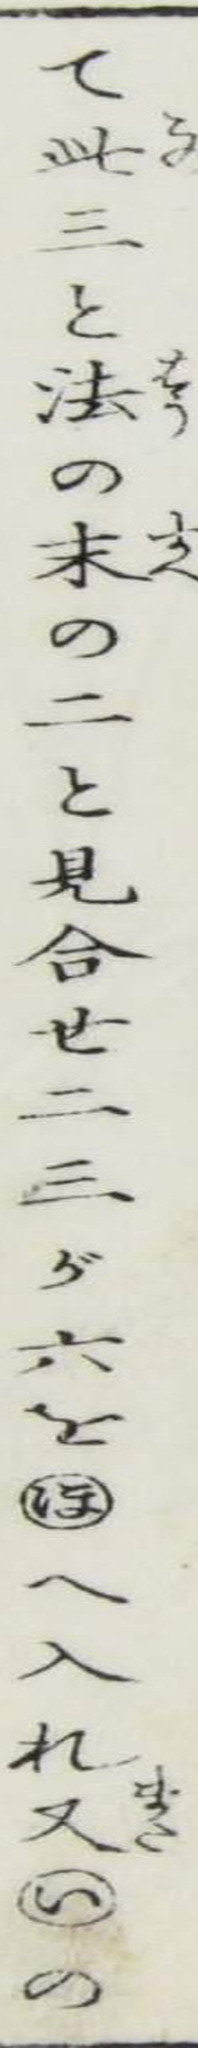て此三と法の末の二と見合せ二三が六を㋭へ入れ又㋑の
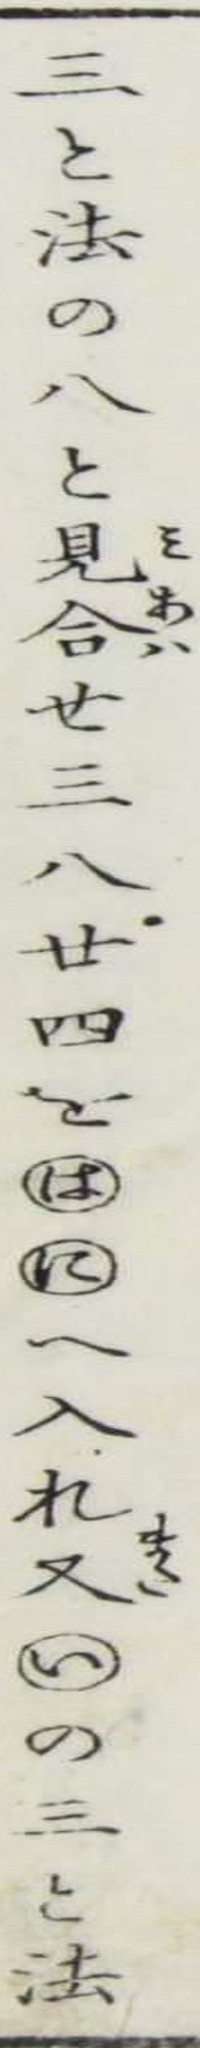三と法の八と見合せ三八．廿四を㋩㋥へ入れ又㋑の三と法
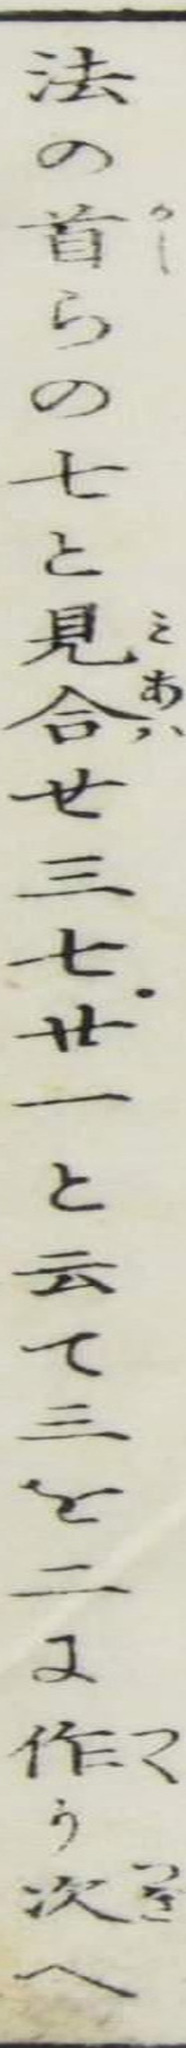法の首らの七と見合三七．廿一と云て三を二に作り次へ

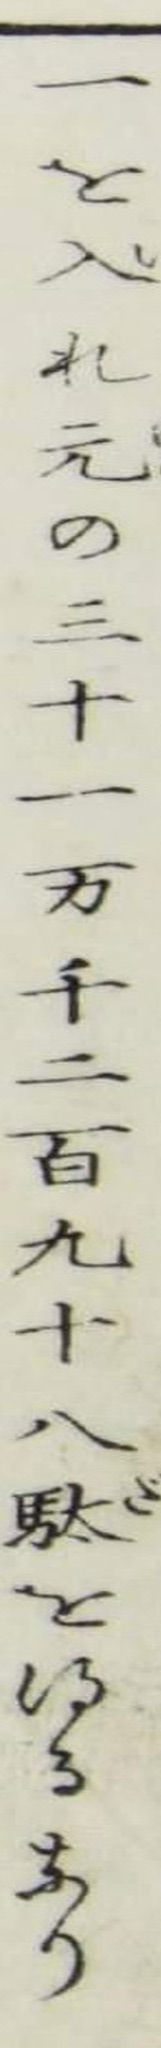一を入れ元の三十一万千二百九十八駄を得るなり
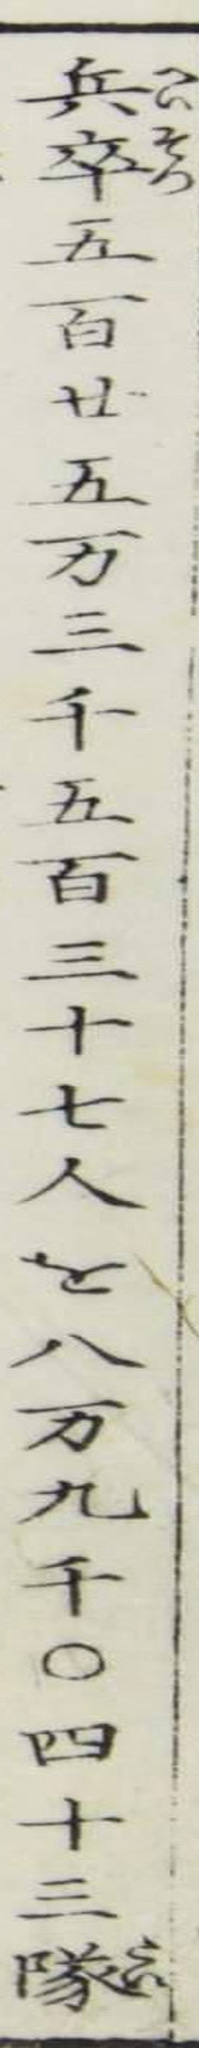兵卒五百廿五万三千五百三十七人を八万九千〇四十三隊
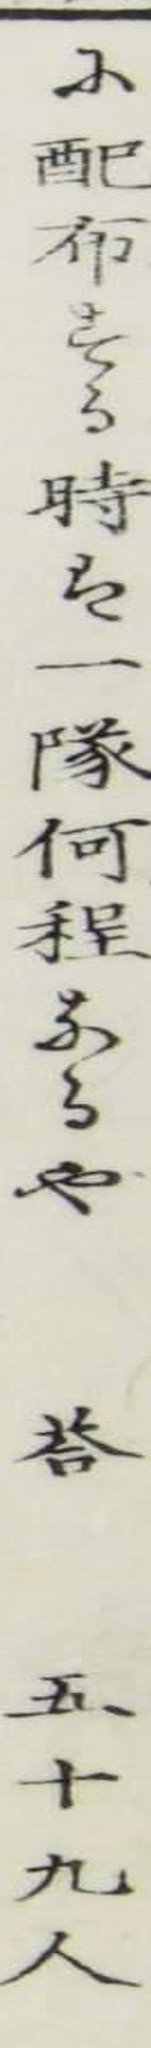に配布する時は一隊何程なるや答五十九人
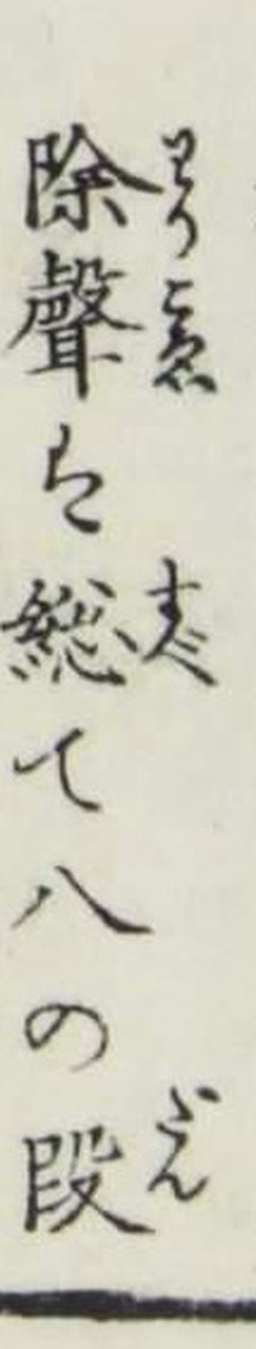除声は総て八の段
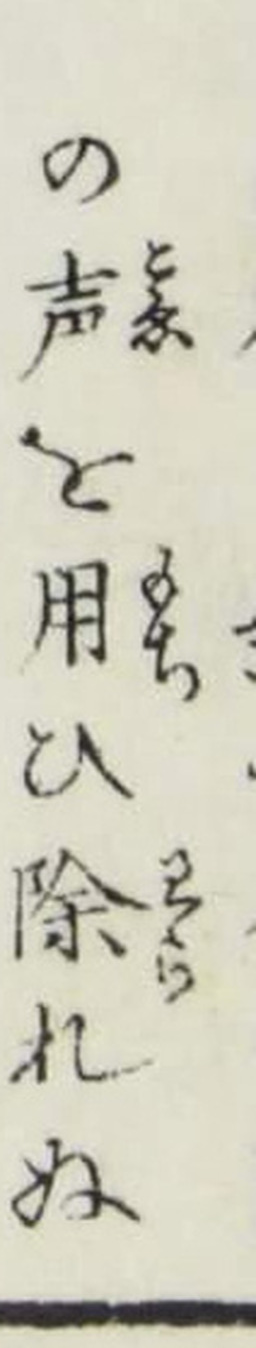の声を用ひ除れぬ
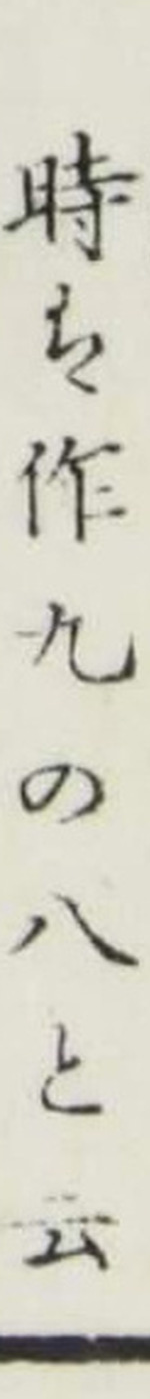時は作九の八と云
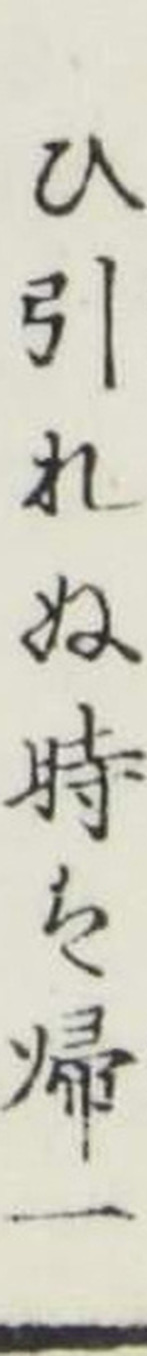ひ引れぬ時は帰一
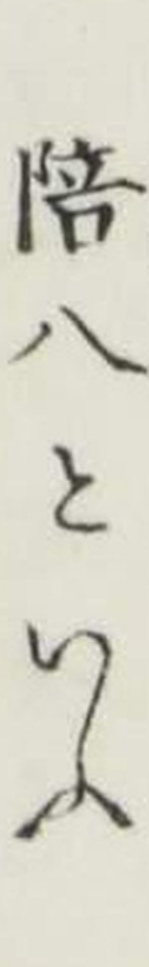陪八といふ
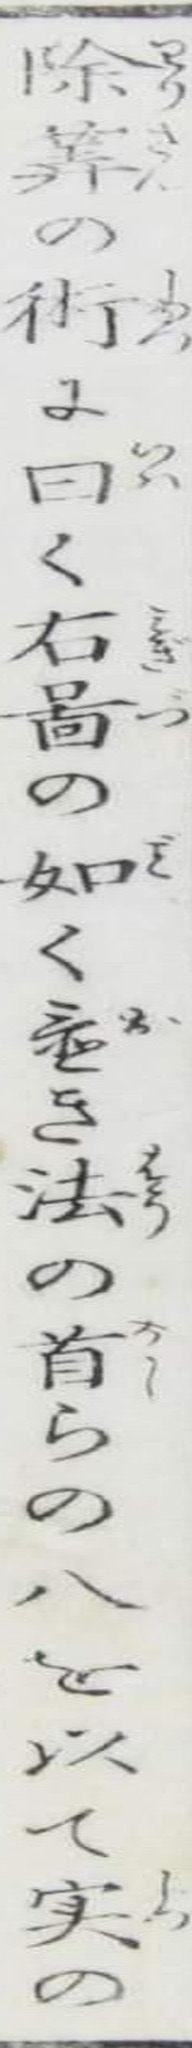除算の術に曰く右図の如く置き法の首らの八を以て実の
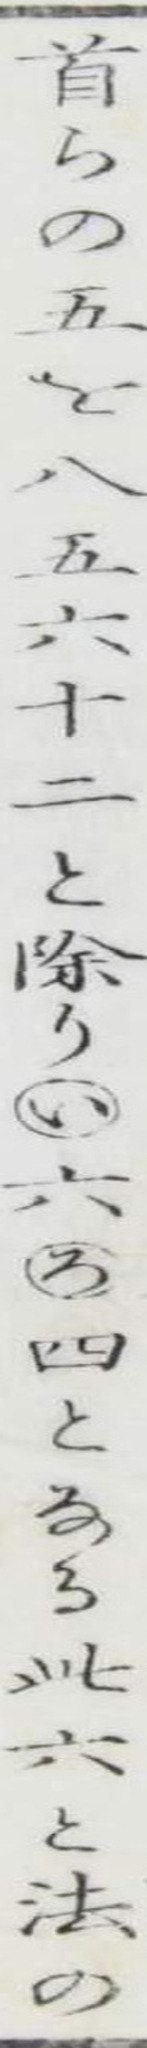首らの五を八五．六十二と除り㋑六㋺四となる此六と法の
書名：明治小學塵劫記 卷1
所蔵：東京学芸大学教育コンテンツアーカイブ
